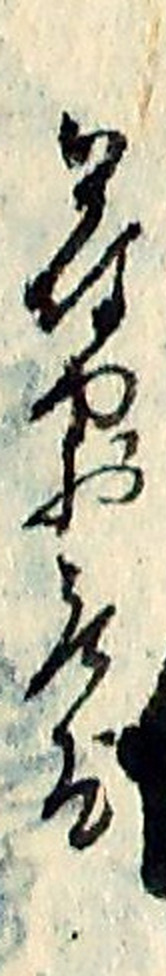府中村庄屋
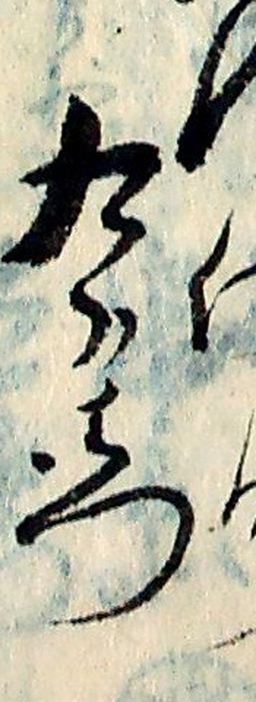九郎右衛門
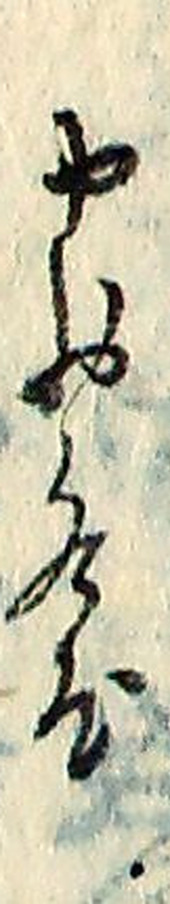中村庄屋
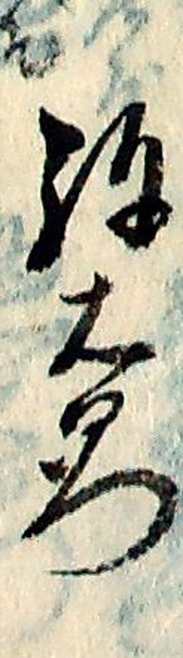弥右衛門
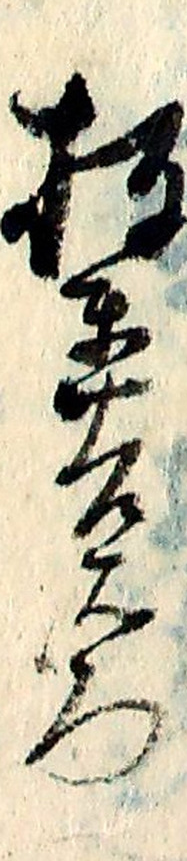坂東吉右衛門
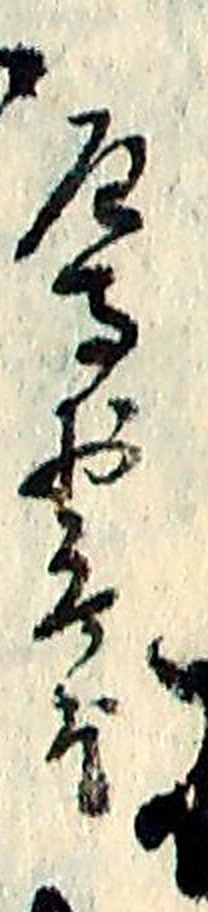尼寺村庄屋
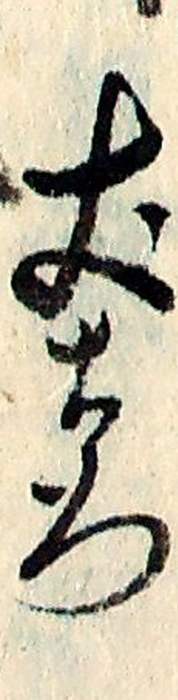丈右衛門
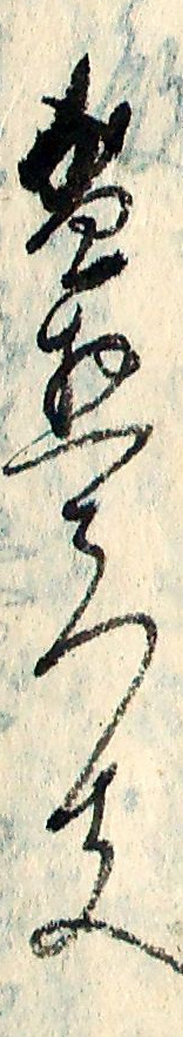盛惣右衛門殿

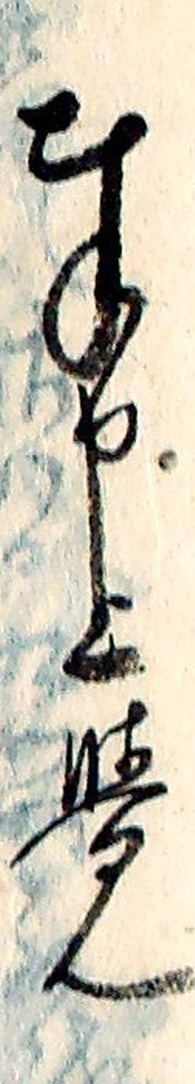奉申上覚
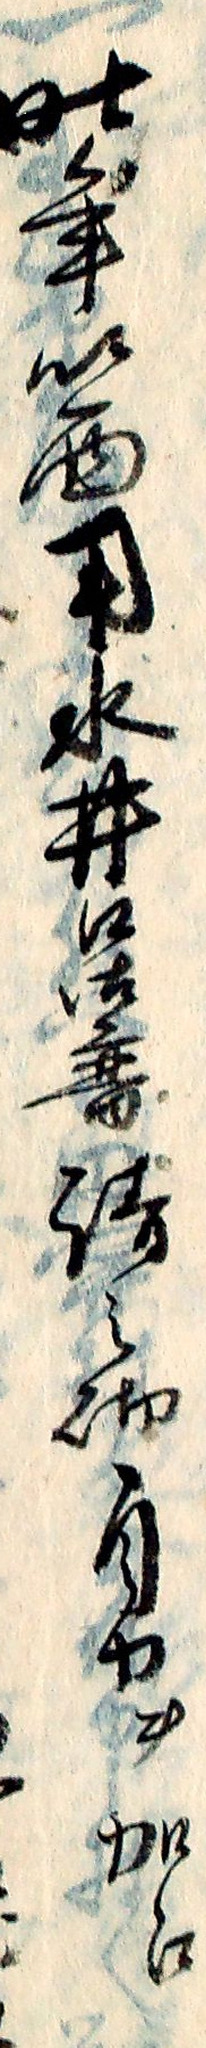昨年以西用水井口御普請之砌自力を加え
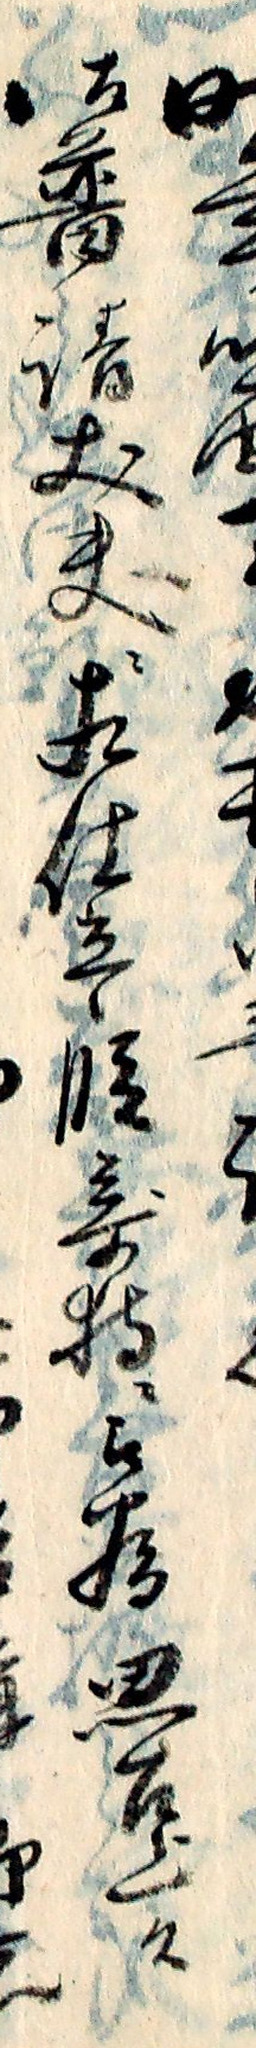御普請丈夫に相仕立候段奇特に被為思召上候
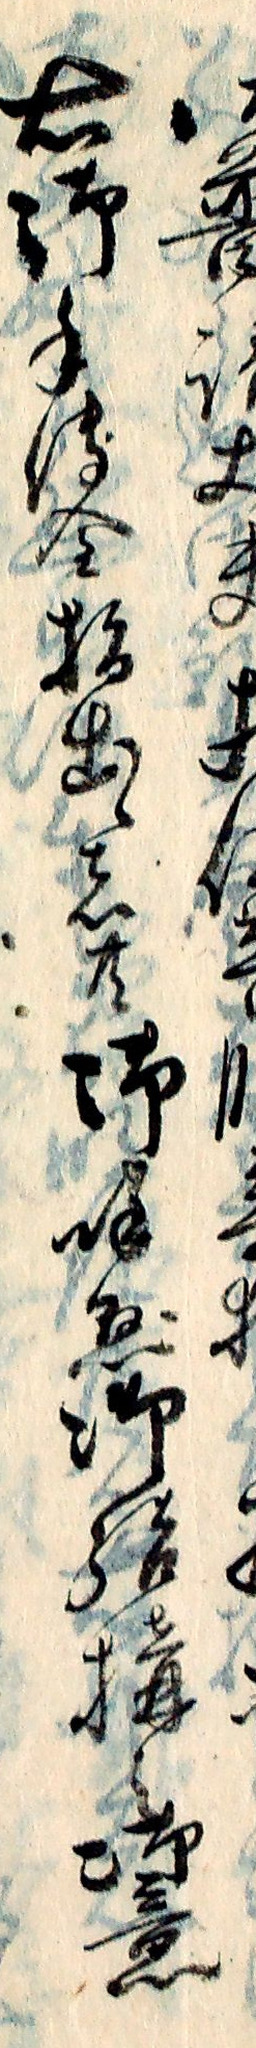右御手伝金指出候者共御呼懸御結構之御意
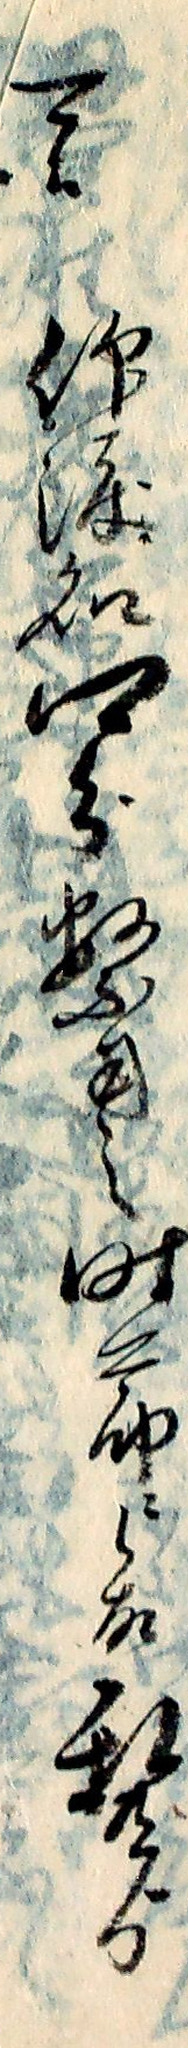可被仰渡処郷分繁用之時節に候故私共ゟ
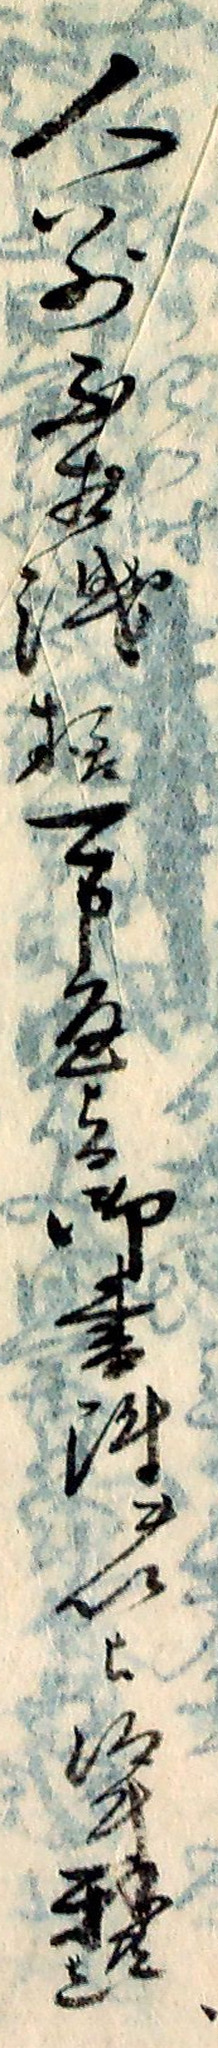人別不相洩様可申通旨御書附を以被仰付私共迄
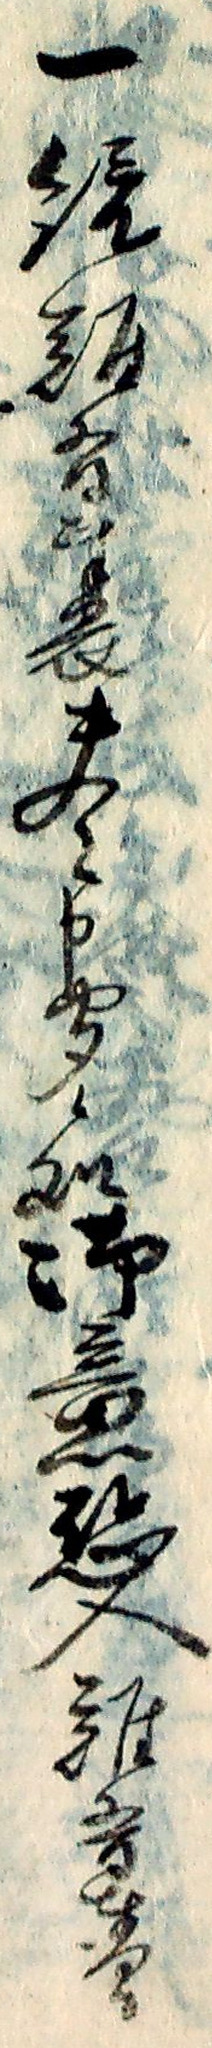一統難有奉畏夫々申聞候処御意恐入難有奉存候
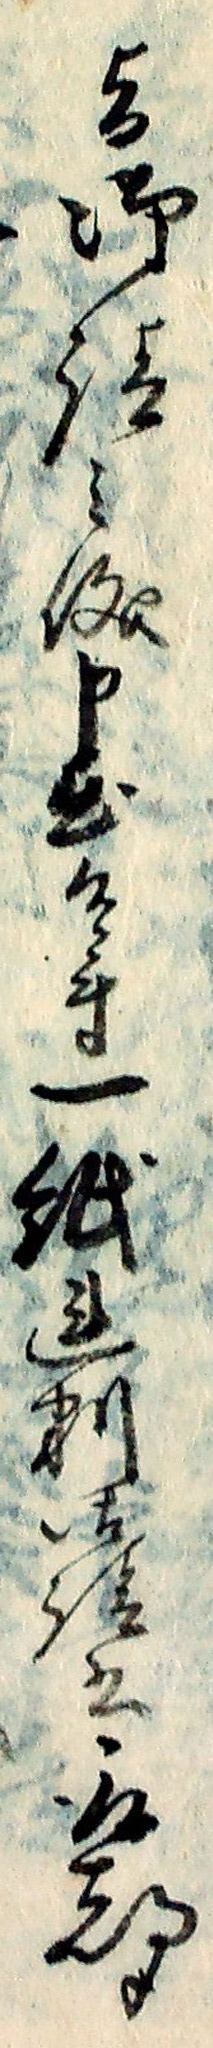旨御請之儀申出候に付一紙連判御請書取都め
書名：諸御願書控(後藤氏壱番）
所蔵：鳴門教育大学 Naruto University of Education
